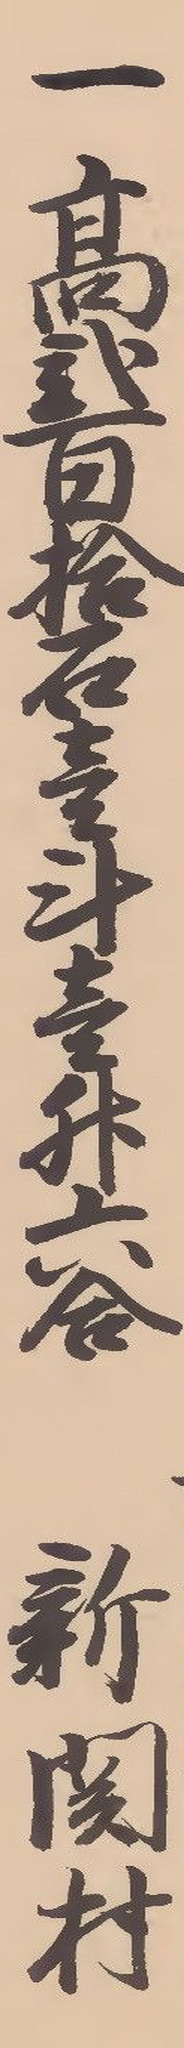一高弐百拾石壱斗壱升六合新関村
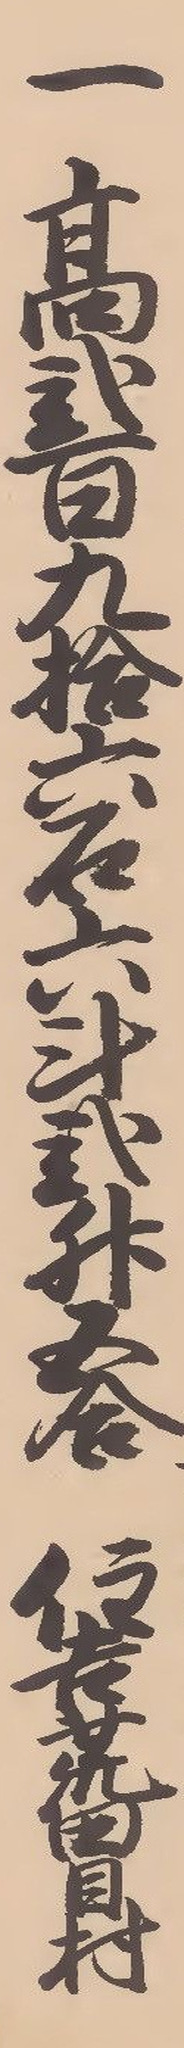一高弐百九拾六石六弐斗弐升五合住吉荒田目村
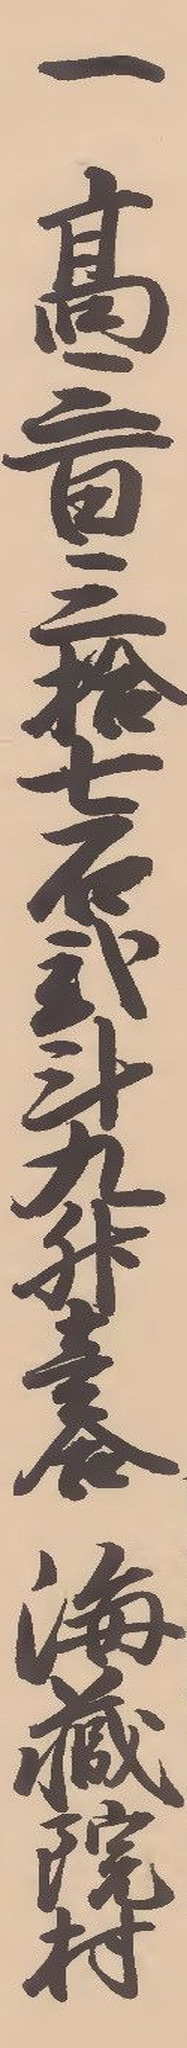一高三百三拾七石弐斗九升壱合海蔵院村
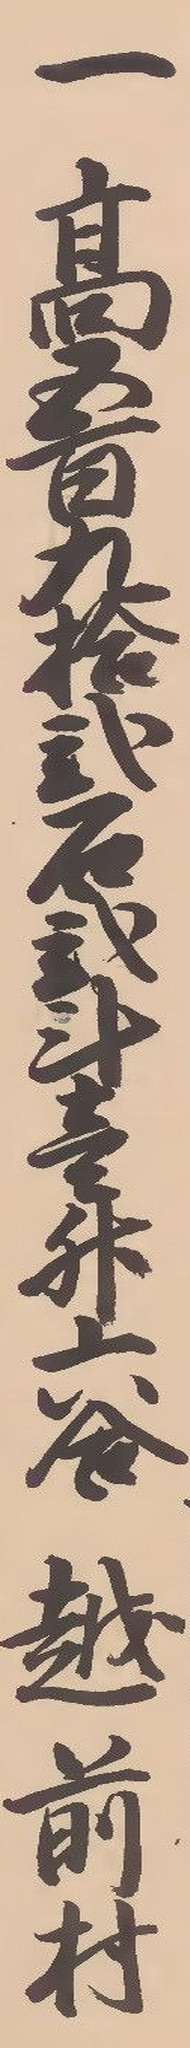一高五百九拾弐石弐斗壱升六合越前村
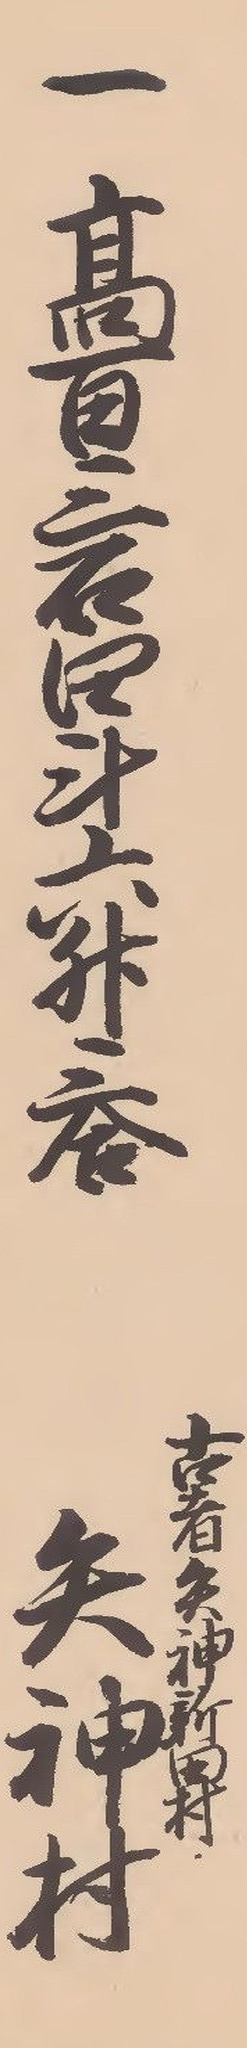一高百三石四斗六升三合矢神村
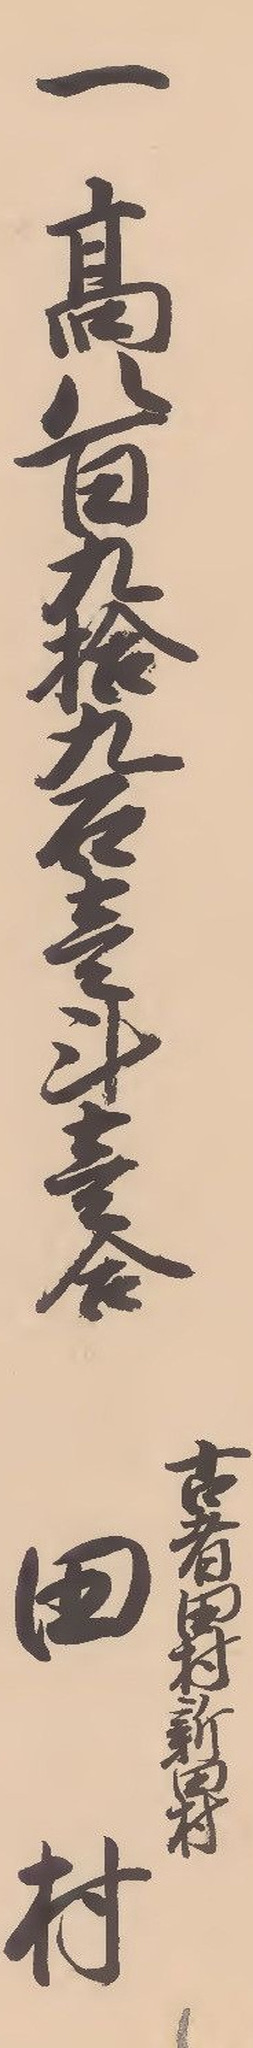一高八百九拾九石壱斗壱合田村
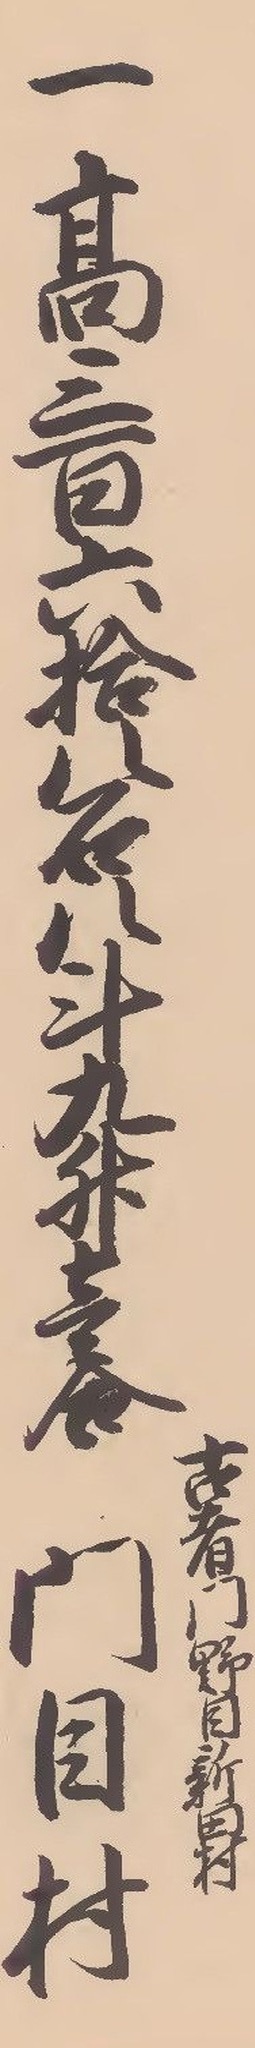一高三百六拾八石八斗九升壱合門目村

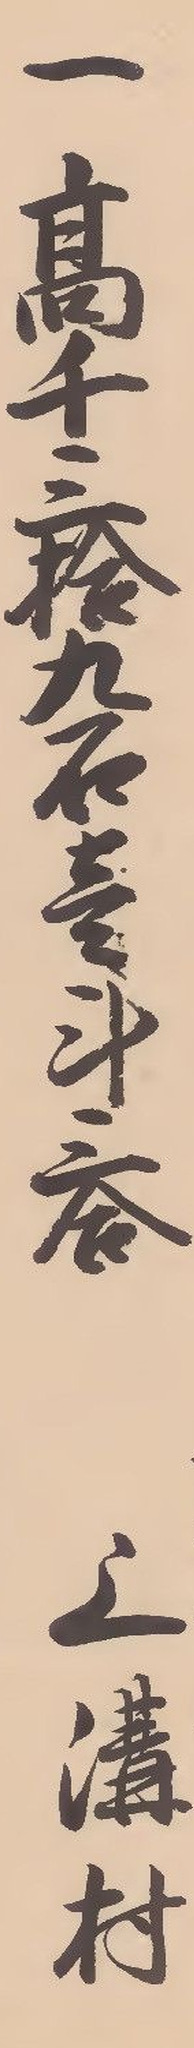一高千三拾九石壱斗三合上溝村
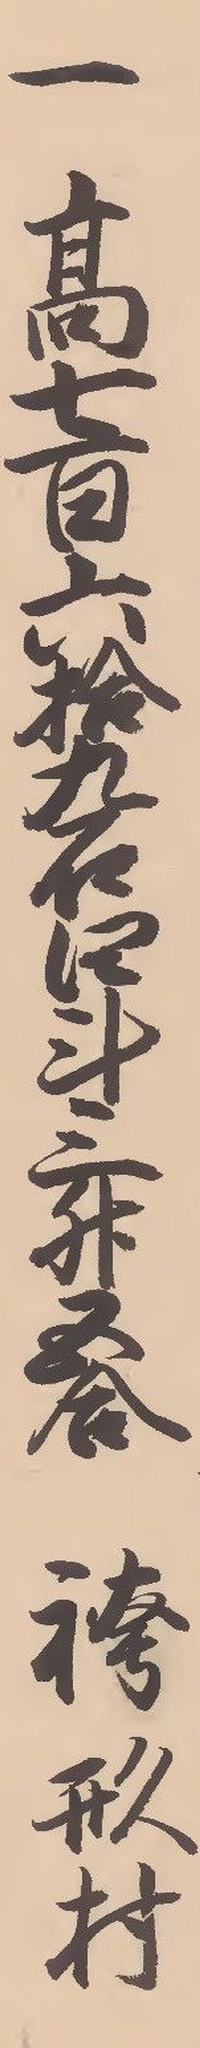一高七百六拾九石四斗三升五合袴形村
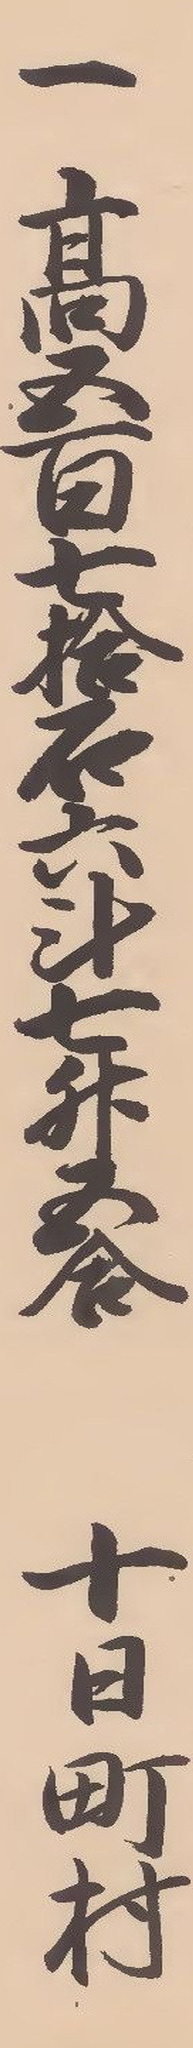一高五百七拾石六斗七升五合十日町村
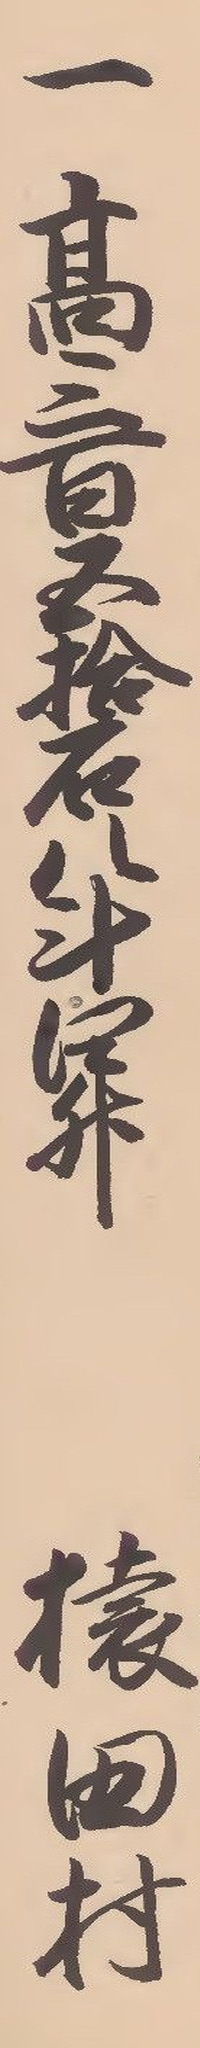一高三百五拾石八斗四升猿田村
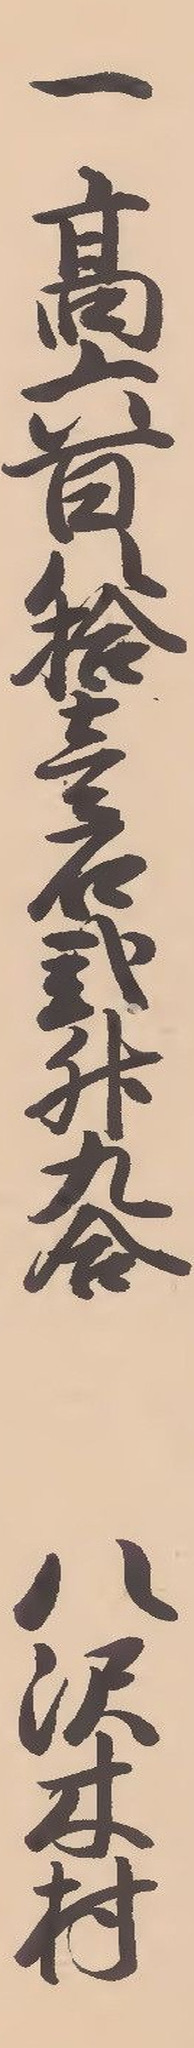一高六百八拾壱石弐升九合八沢木村
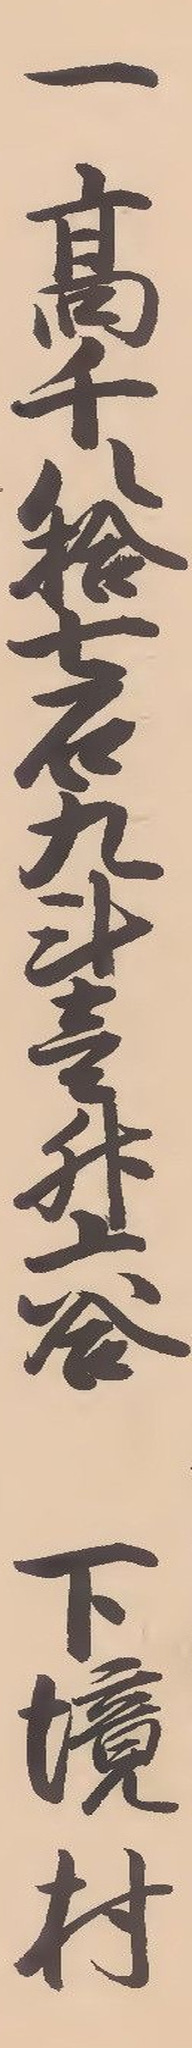一高千八拾七石九斗壱升六合下境村
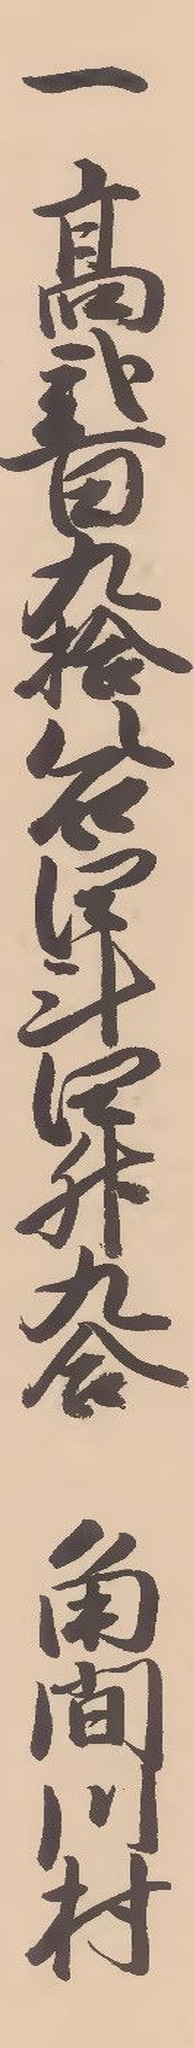一高弐百九拾八石四斗四升九合角間川村
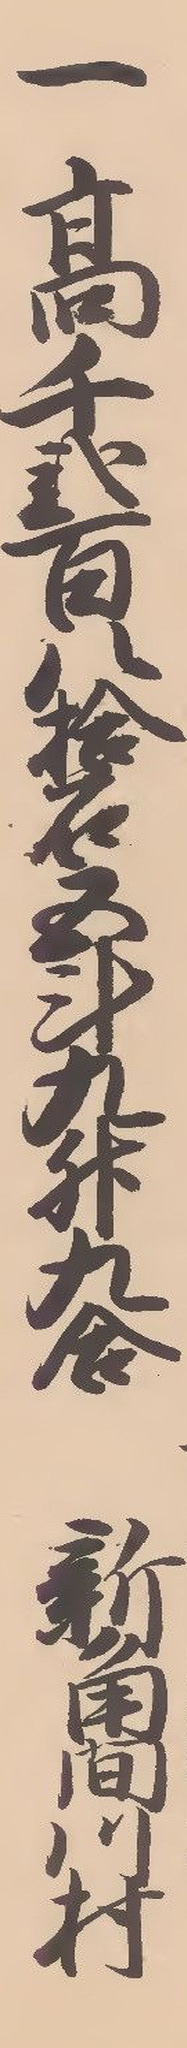一高千弐百八拾石五斗九升九合新角間川村

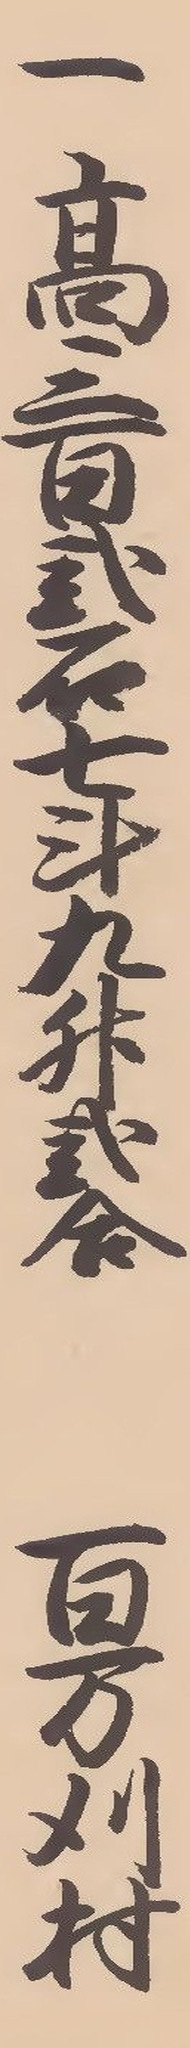一高三百弐石七斗九升弐合百万刈村
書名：出羽国郷帳　５
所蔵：国立公文書館 National Archives of Japan
